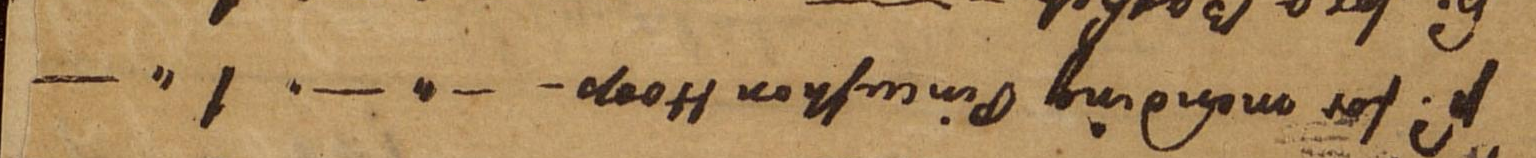p^d. for mending Pincushon Hoop- ..-..1..-
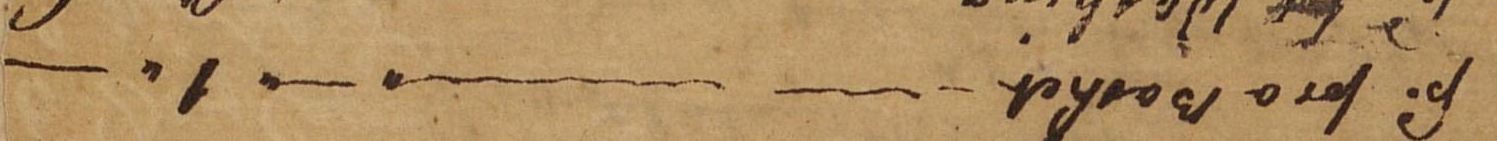p^d. for a Basket- ..-..1..-
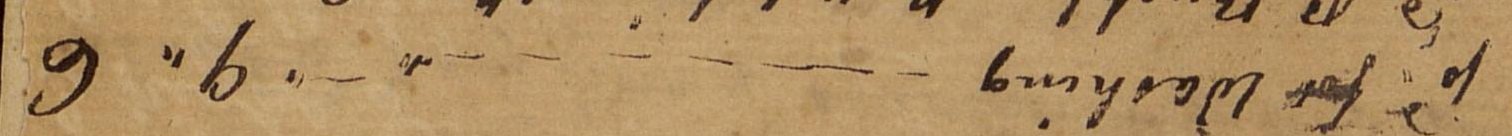p^d. for Washing- ..-..9..6
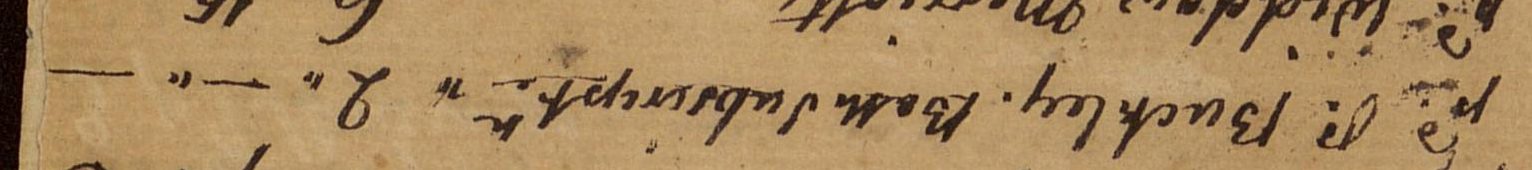p^d. P. Buckley. Bath Subsirept^h. ..2..-..-
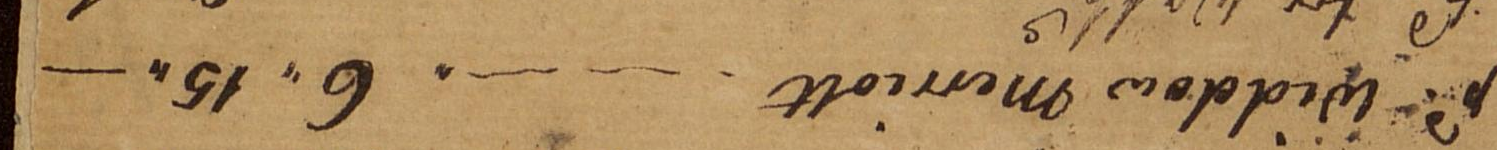p^d. Widdow Merriott- .. 6.. 15..-
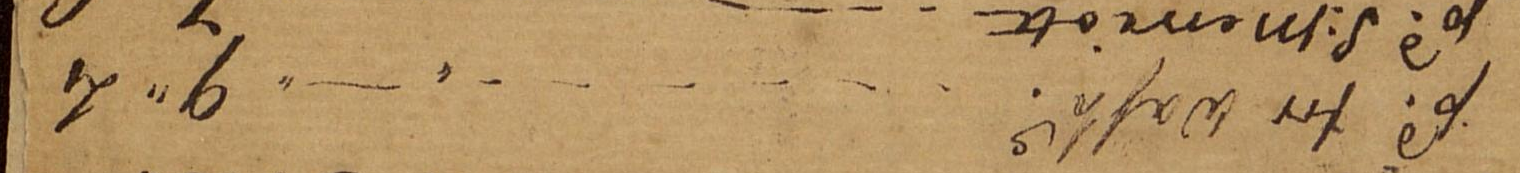p^d. for [Wash^g.]- ..-..9.. 4
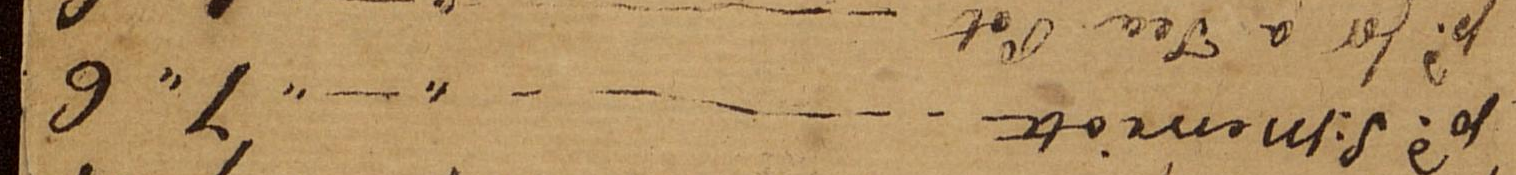p^d. S:Merriott- ..-..7.. 6
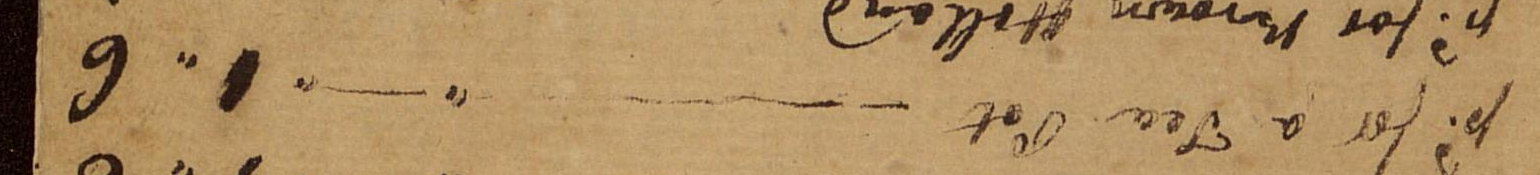p^d. for a Tea Pot- ..-..1..6
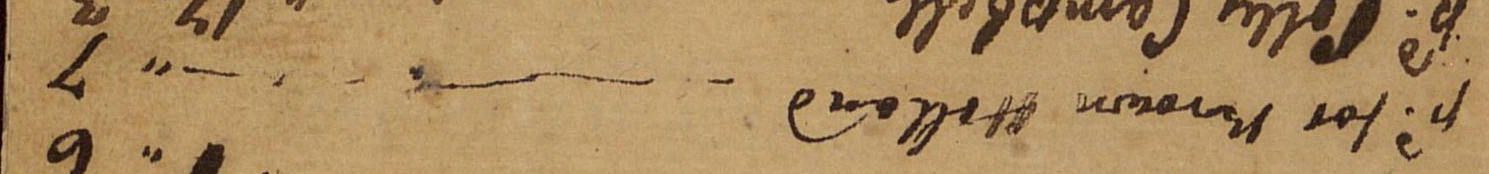p^d. for Brown Holland- ..-..- .. 7
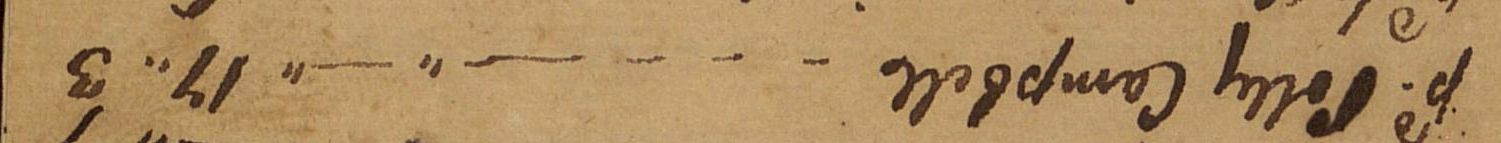p^d. Polly Campbell- -..-..17.. 3
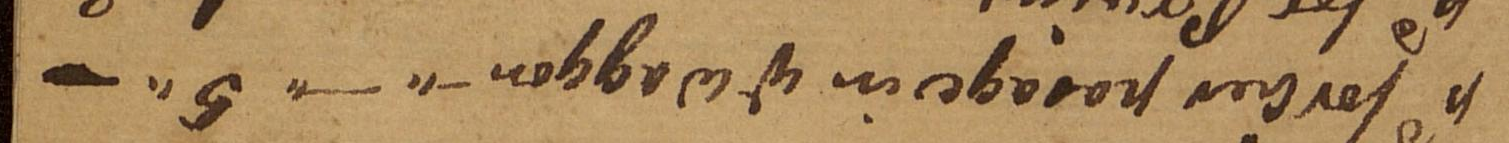p^d for our pasage in y^e waggon- ..-..5..-
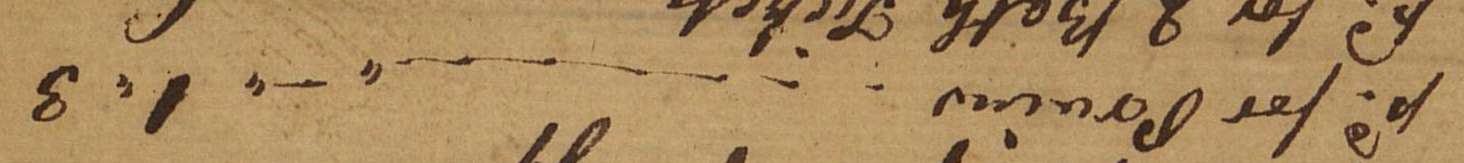p^d. for Pruins.- ..-..1..3
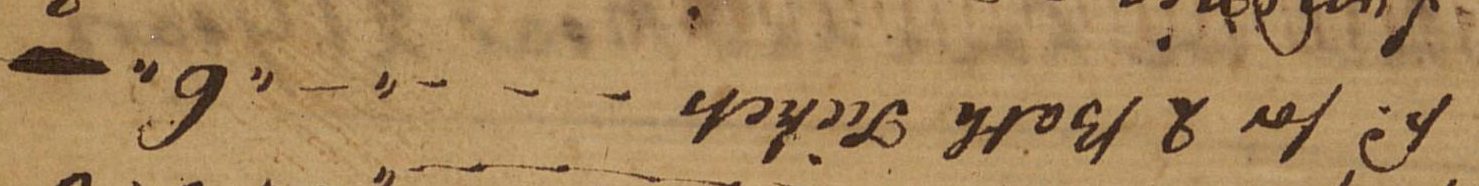p^d. for 2 Bath Tickets- -..-..6..-
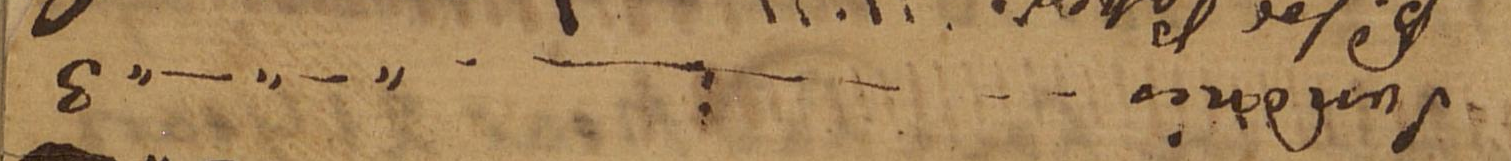Sundries- - ..- ..-..3
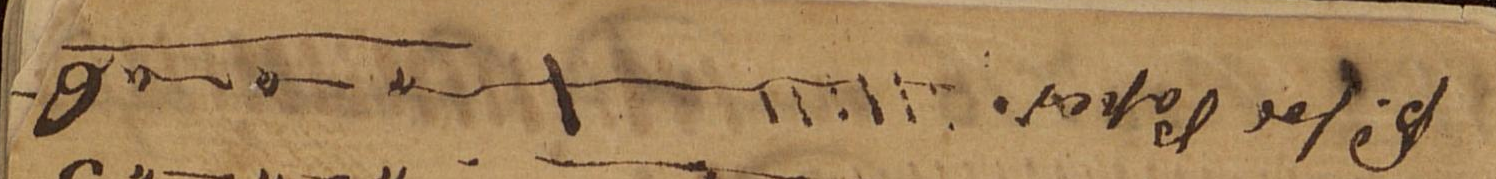p^d. for Paper.- ..-..-..6
